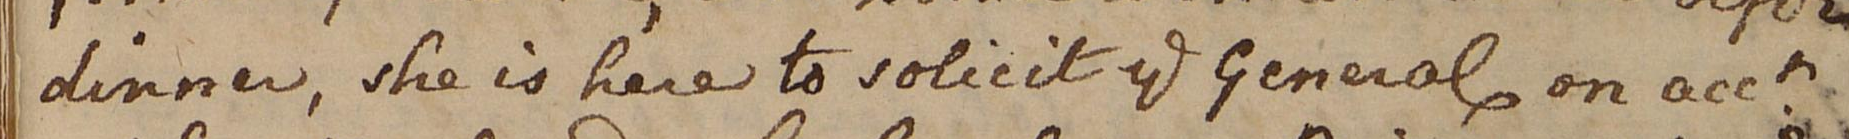dinner, she is here to solicit y^e General on acc^t.
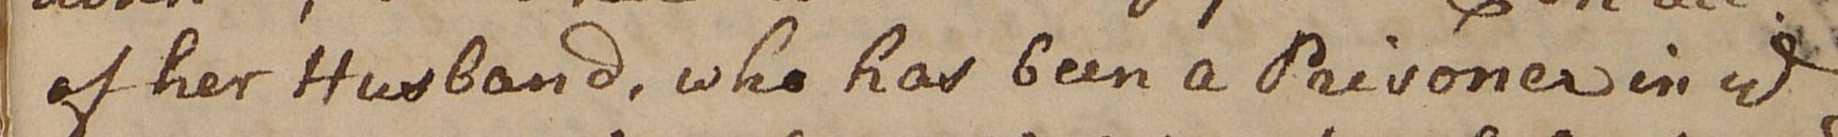of her Husband, who has been a Prisoner in y^e
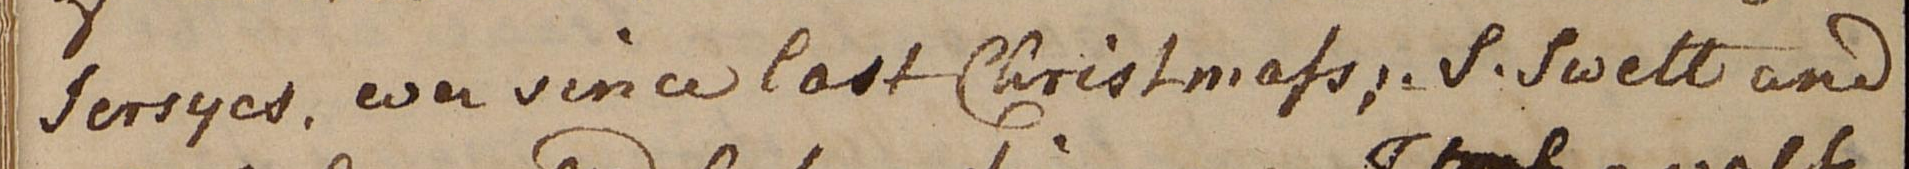Jersyes, ever since last Christmass; S. Swett and
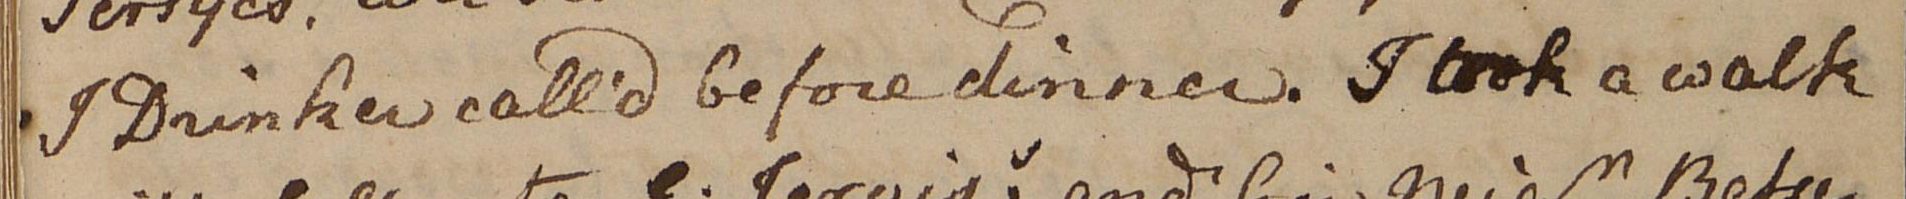I Drinker call'd before dinner. I took a walk
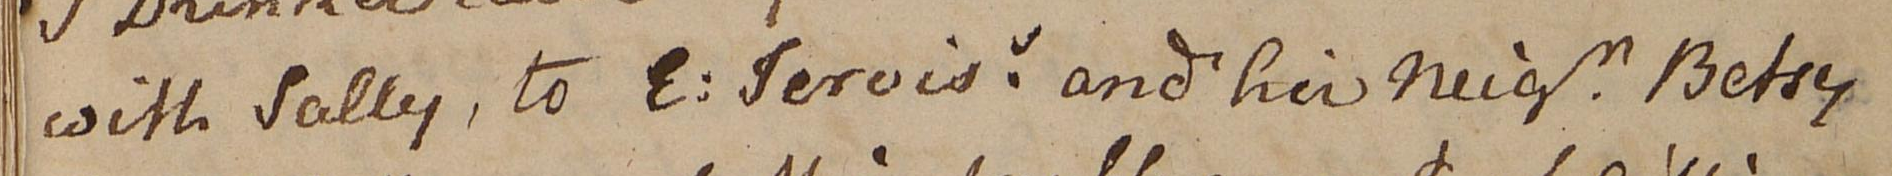with Sally, to E: Jervis^s. and hir Neig^r. Betsy
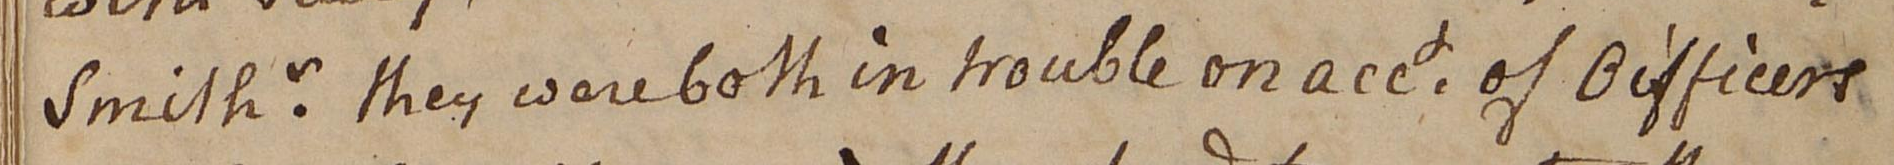Smith^s. they were both in trouble on acc^t. of Oifficers
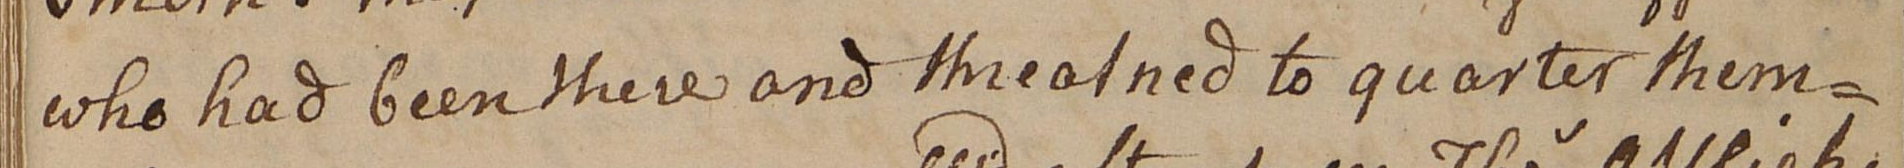who had been there and threatned to quarter them-
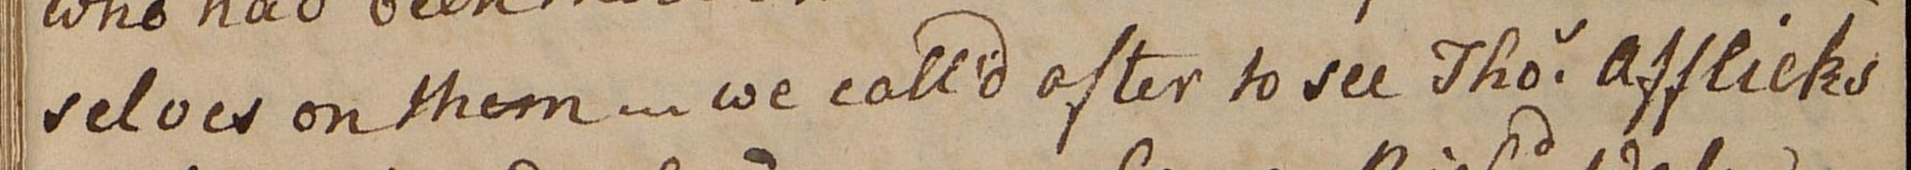selves on them - we call'd after to see Tho^s. Afflicks
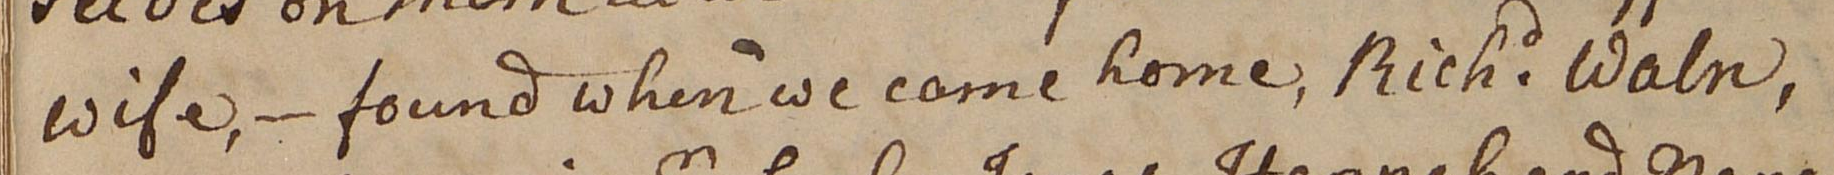wife,- found when we came home, Rich^d. Waln,
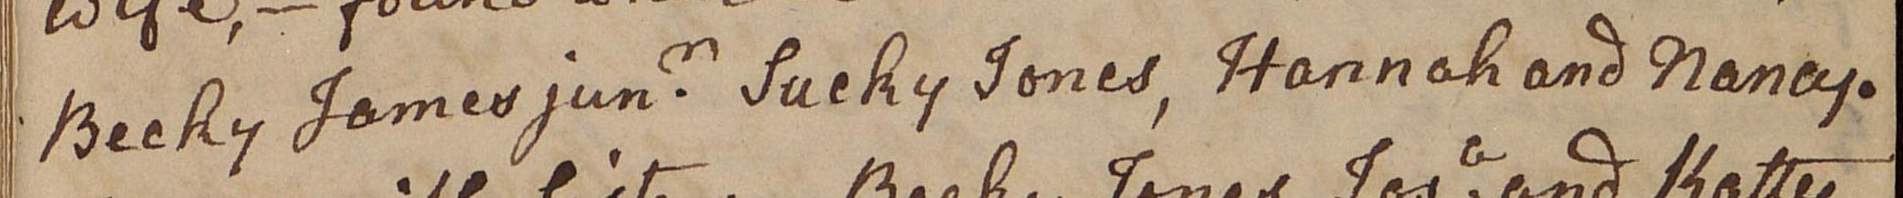Becky James jun^r. Sucky Jones, Hannah and Nancy.
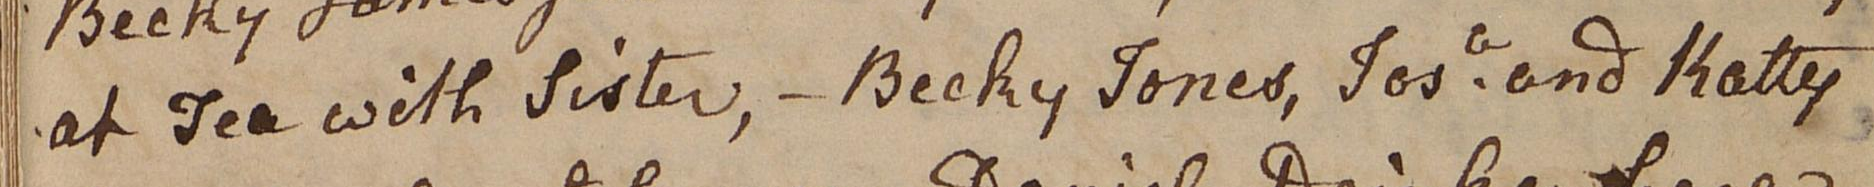at Tea with Sister,- Becky Jones, Jos^a. and Katty
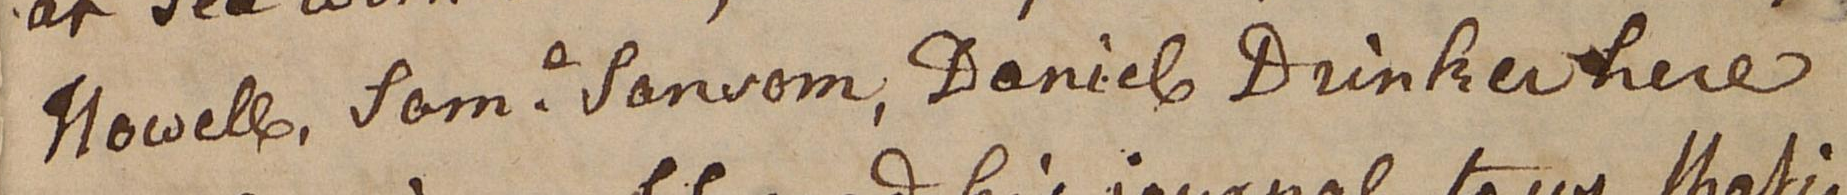Howell, Sam^l. Sansom, Daniel Drinker here
